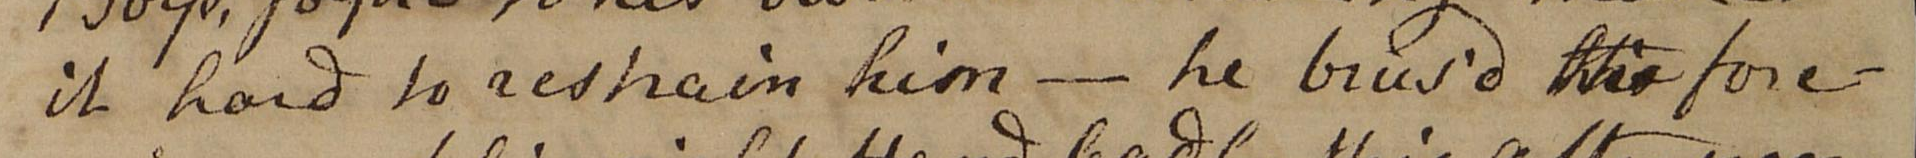it hard to restrain him- he brus'd his fore-
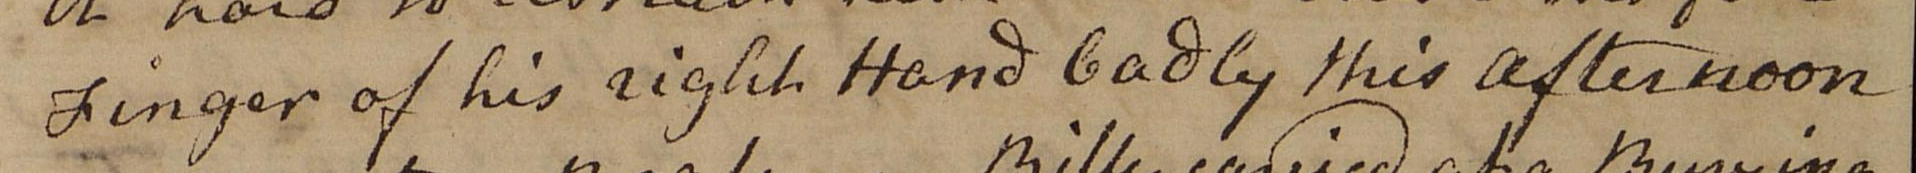Finger of his right Hand badly this afternoon
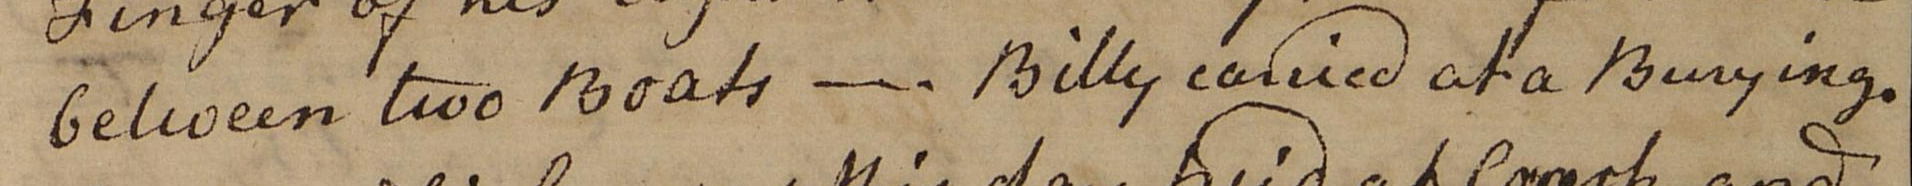between two Boats- Billy carried at a Burying.
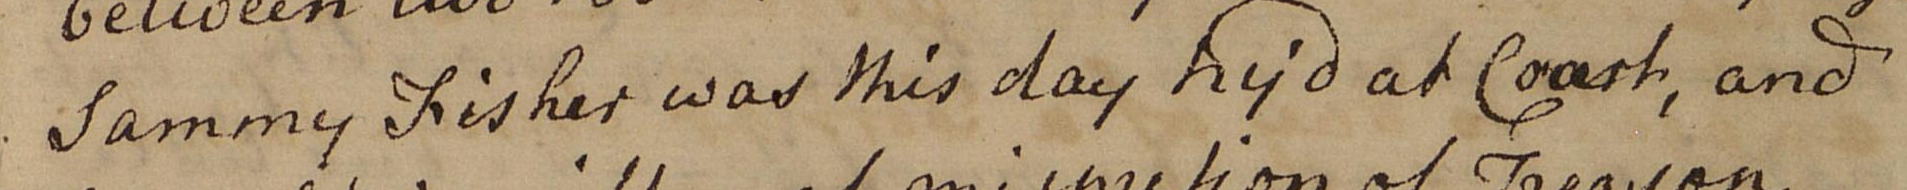Sammy Fisher was this day try'd at Coart, and
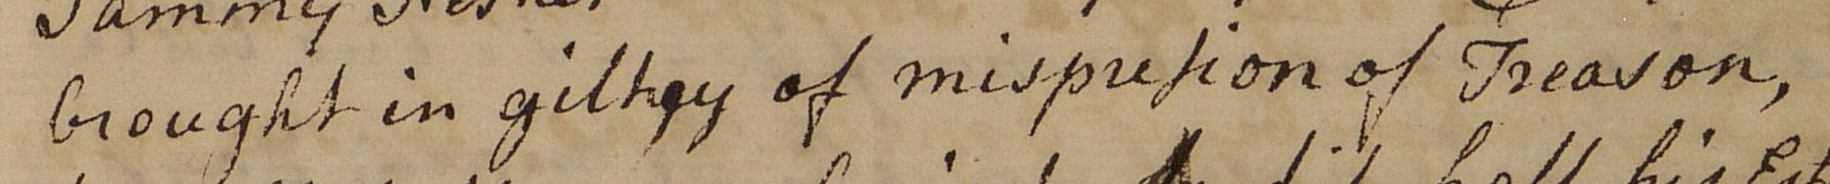brought in giltey of mispresion of Treason,
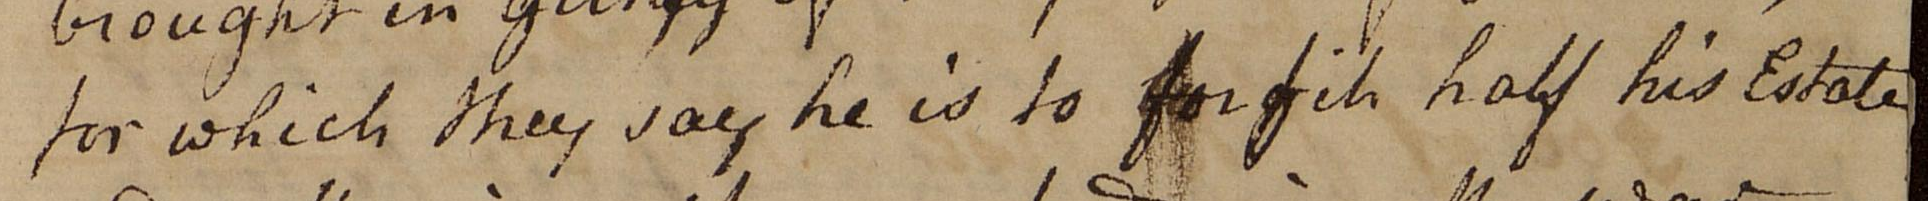for which they say he is to for fit half his Estate
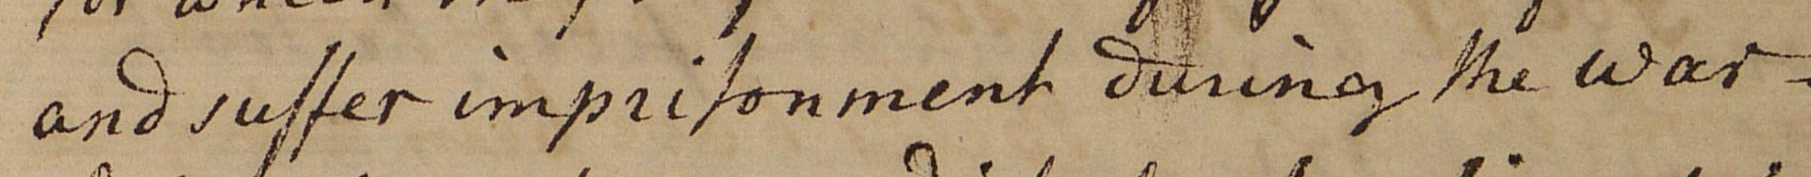and suffer imprisonment during the war -
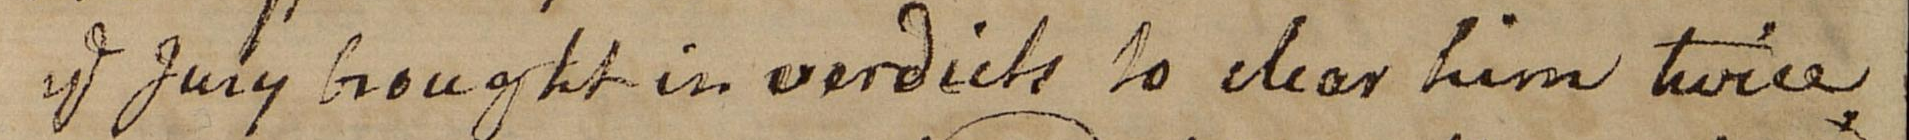y^e Jury brought in verdicts to clear him twice
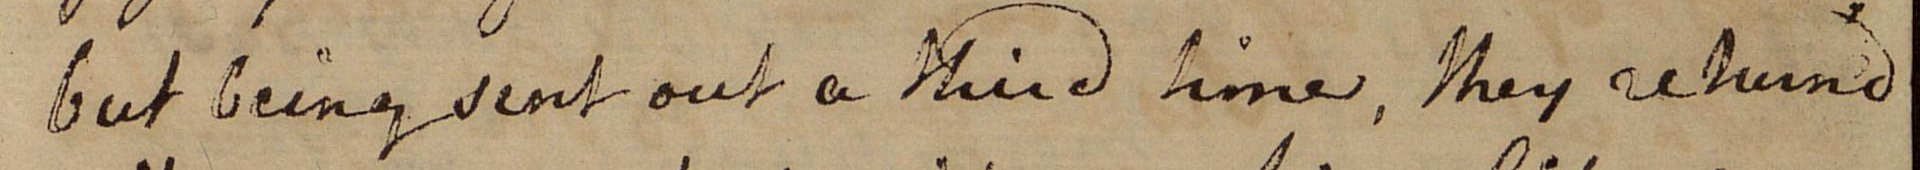but being sent out a third time, they return'd
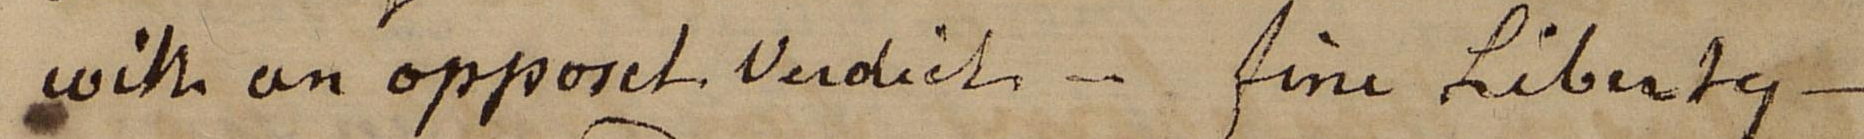with an opposet Verdict- fine Liberty-
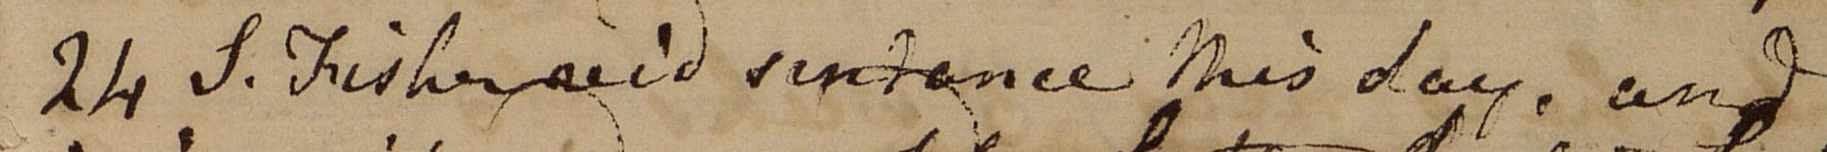24 S. Fisher rec'd sentence this day, and
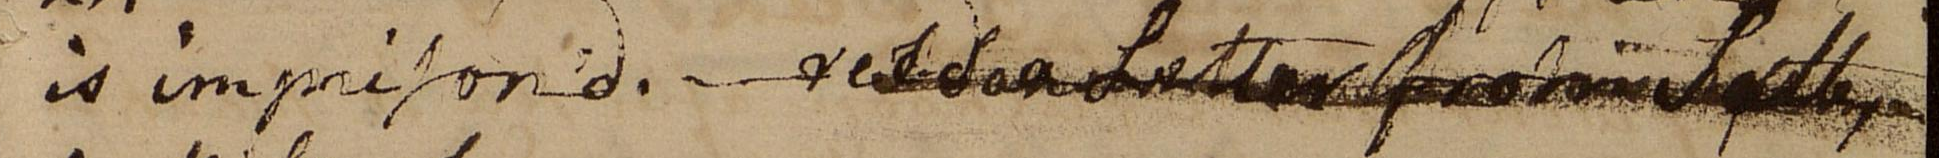is imprison'd.-[re J San Letter from Sally]
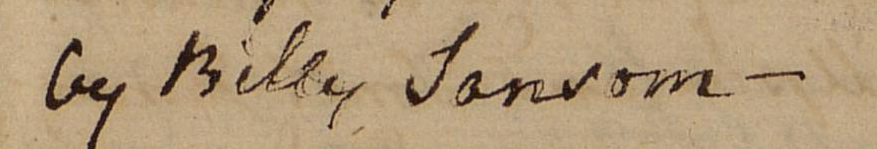by Billy Sansom-
